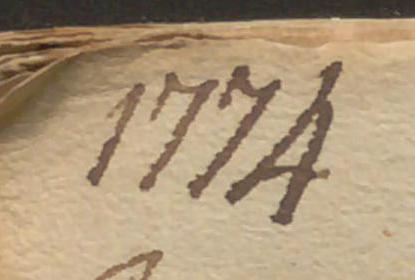1774
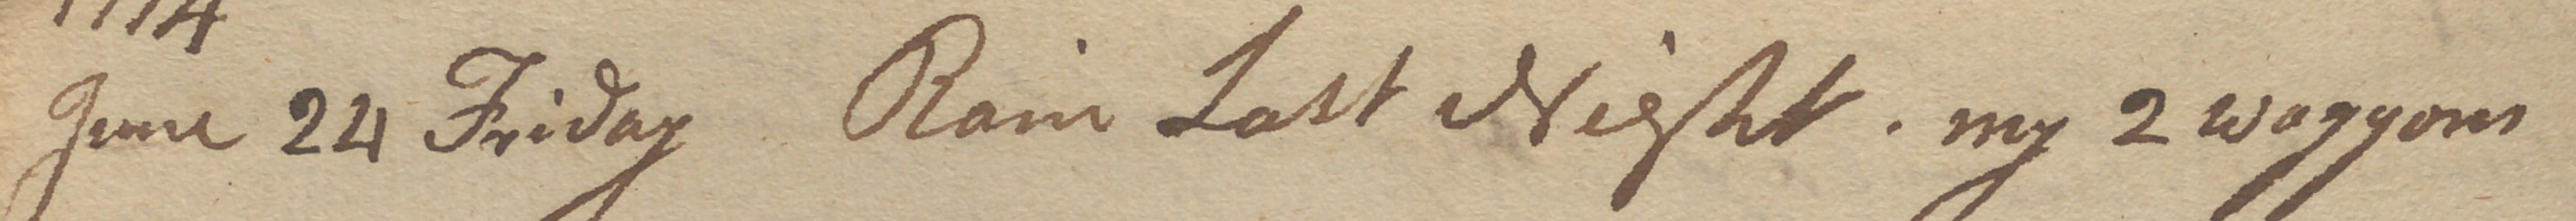June 24 Friday Rain Last Night. my 2 waggons
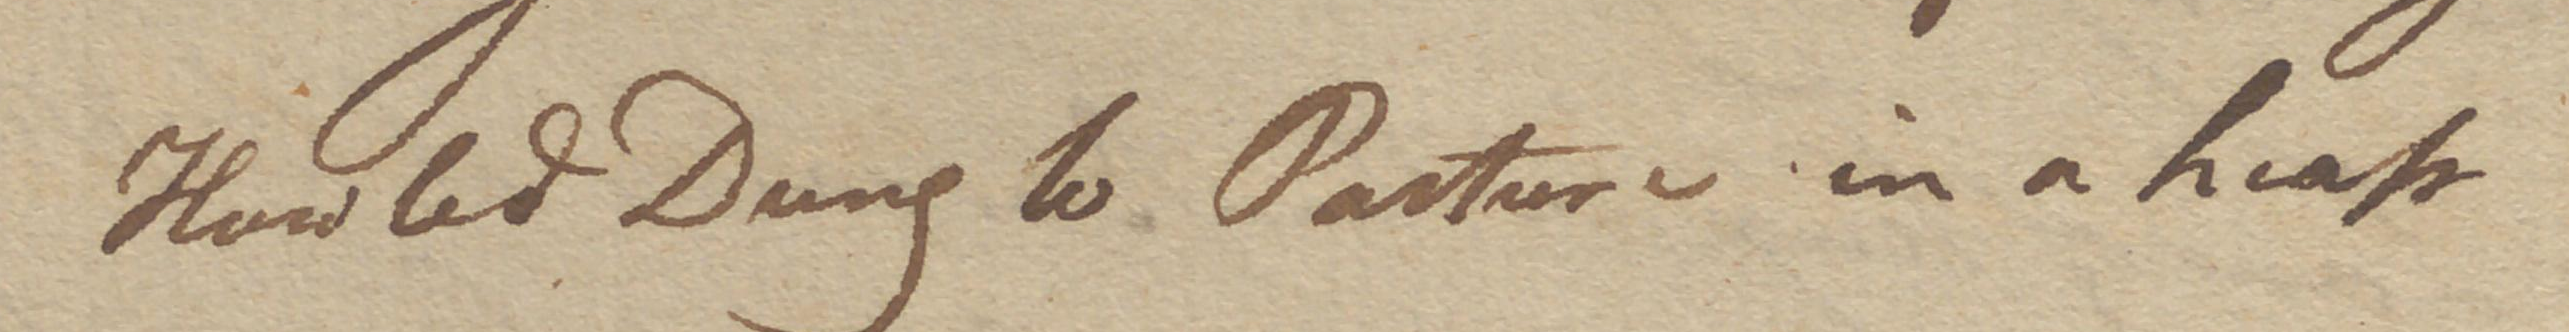Hawled Dung to Pasture in a heap
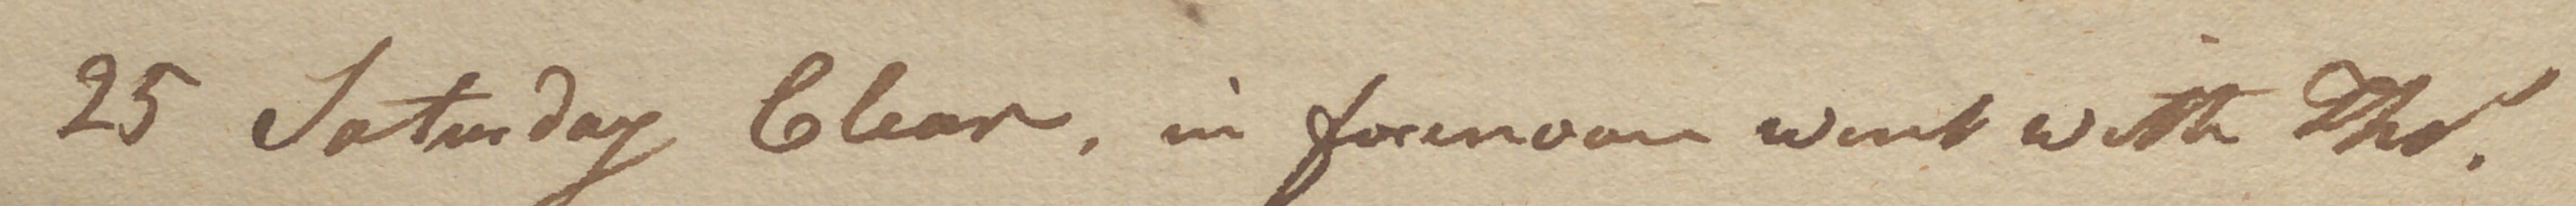25 Saturday, Clear, in forenoon went with Tho^s.
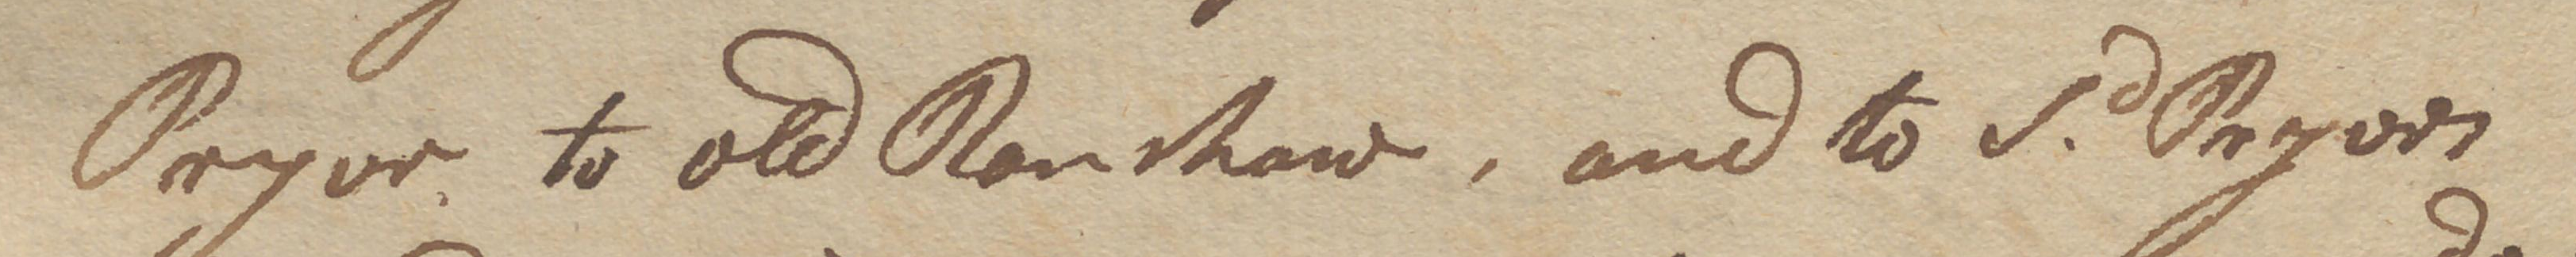Pryor to old Renshaw, and to s^d. Pryors
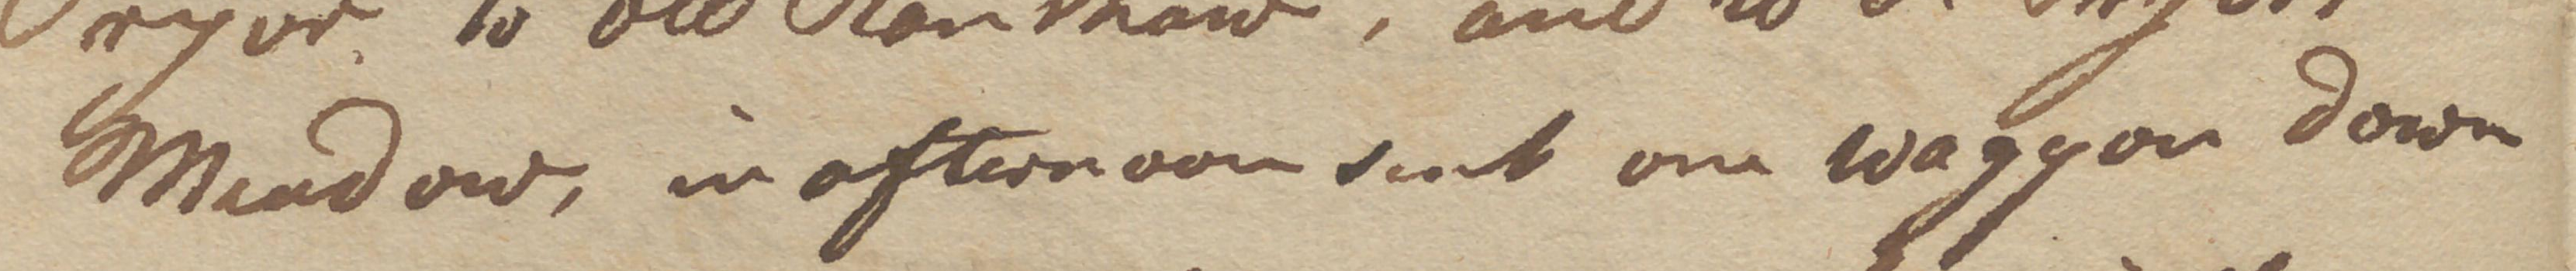Meadow, in afternoon sent one waggon down
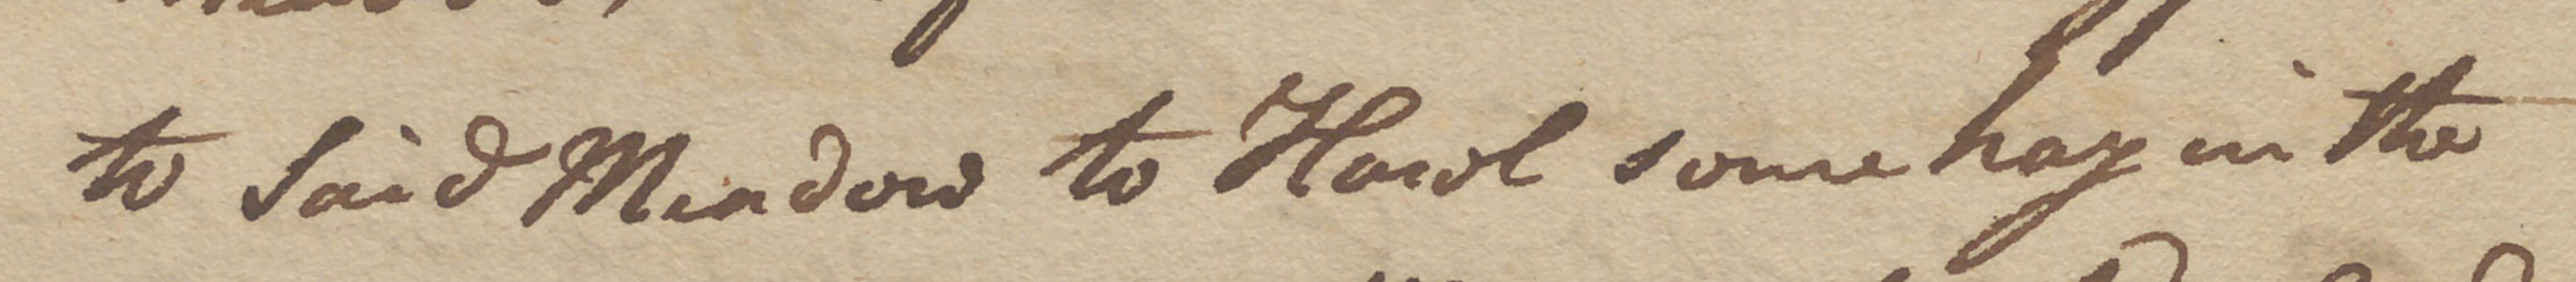to said Meadow to Hawl some hay in the
